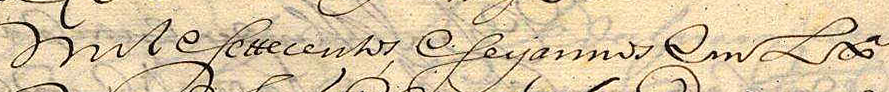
mil e settecentos e seis annos em Lxa
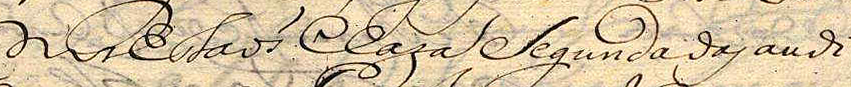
nos Estaos E Caza Segunda das audi
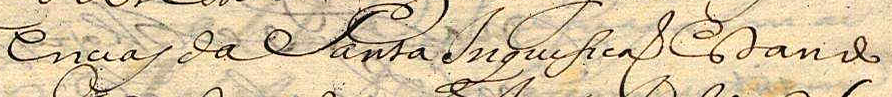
encias da Santa Inquisiçaõ Estando
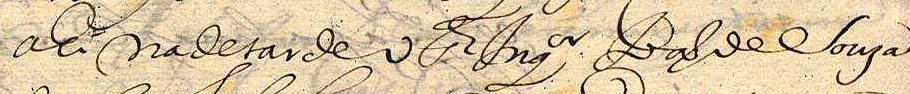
ahi na de tarde o sr Inqor Joaõ de Souza
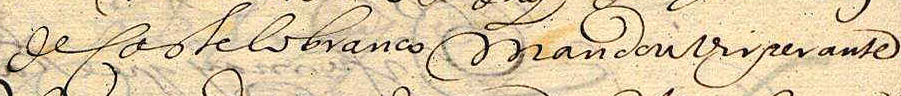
de Castelo branco mandou vir perante
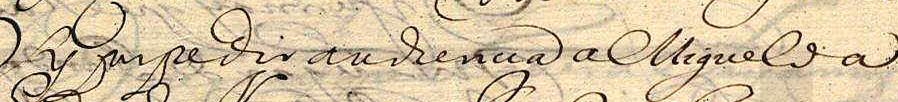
sy por pedir audiencia a Miguel da
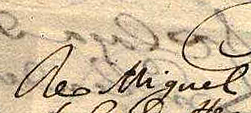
Reo Miguel
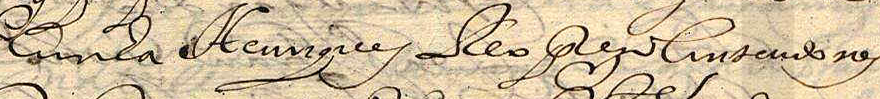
Cunha Henriques Reo pRezo Conteudo nos
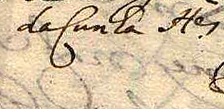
da Cunha H.es
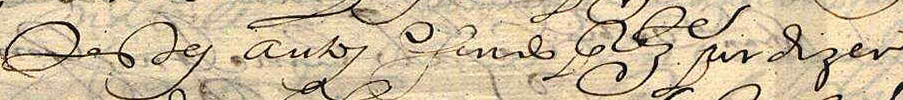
destes autos e sendo pRezte por dizer
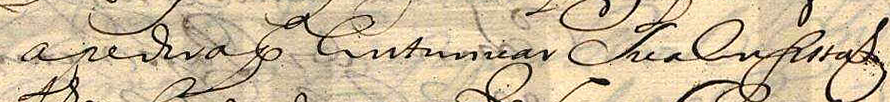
a pedira pa Continuar Sua Confissaõ
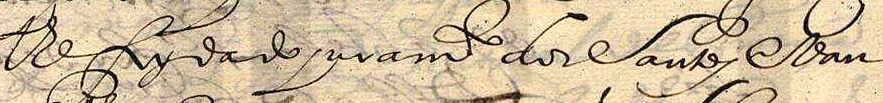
lhe foy dado juramto dos Santos evan
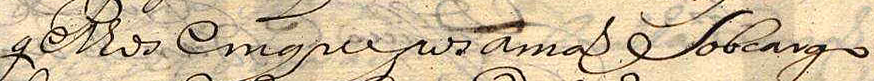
gelhos em que pos a maõ Sob cargo
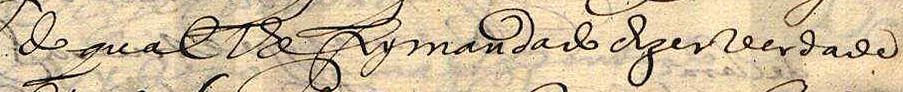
do qual lhe foy mandado dizer verdade
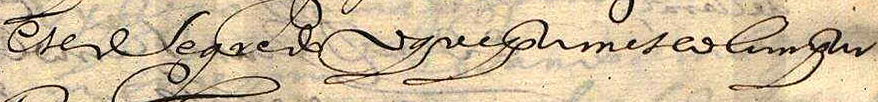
e ter Segredo o que pRometeo Cumprir
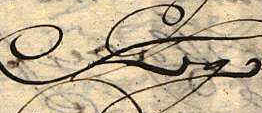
E Logo
